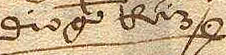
diogo Roīz
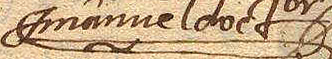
Jmanuel doctor
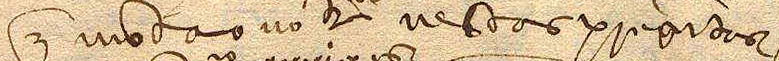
item mōta o notro nestas pregūtas
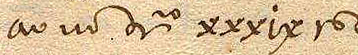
ao notro xxxix rs
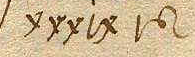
xxxix r̄s
